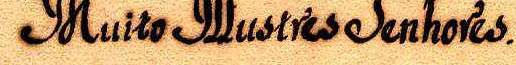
Muito Illstres Senhores.
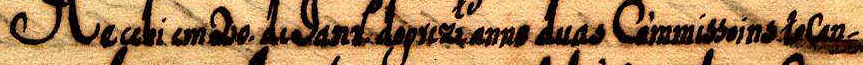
Recebi em 20. de Janr.o do prezete anno duas Cómmissoins toCan
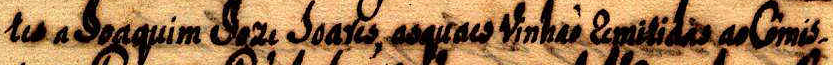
tes a Ioaquim Ioze Soares, as quaes Vinhaõ Remitidas ao Cómis
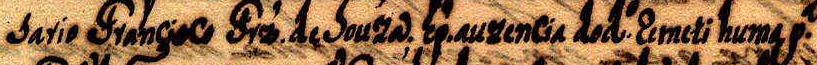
sario Francisco Frz̄ de Souza; e p.r auzencia do d.o Remeti huma p.a
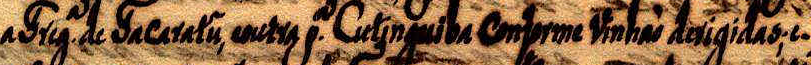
a Freg.a de Tacaratú, e outra p.a Cutinguiba Conforme Vinhaõ derigidas; e
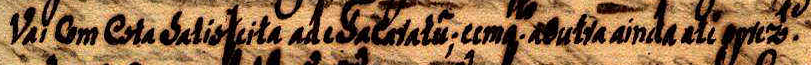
Vai com cota satisfeita a de Tacaratú; e emq.to a outra ainda ate o prez.te
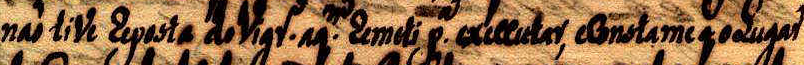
naõ tiVe Resposta do Vigr.o a q.m Remeti p.a execcutar, e Constame q o Lugar
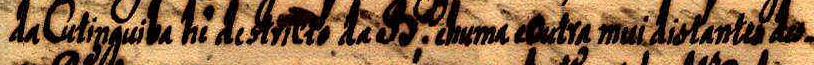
da Cutinguiba hé destricto da Ba; e huma e outra mui distantes des
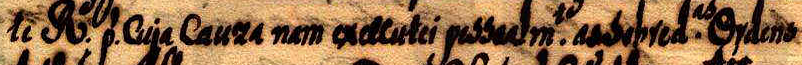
te R.o p̄ cuja cauza nem execcutei pessoalm.te as sobred.as Ordens
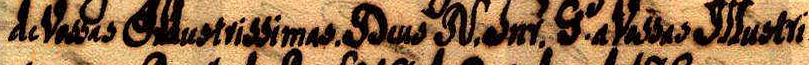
de Vossas Exllustrissimas, Deus N. Snr̄. G.e a Vossas Illustri
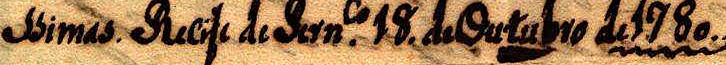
ssimas. Recife de Pern.co 18 de Outubro de 1780.
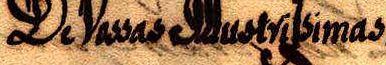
De Vossas Illustrissimas.
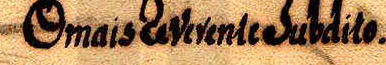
O mais Reverente Subdito.
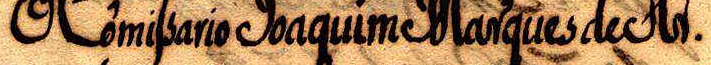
O Cōmissario Ioaquim Marques de Ar.o
